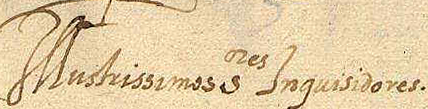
Illustrissimos sores Inquisidores
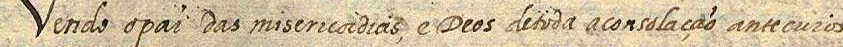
Vendo o pai das misericordias, e Deos de toda a consolaçaõ ante cuios
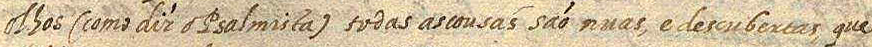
olhos (como diz̄ o Psalmista) todas as cousas saõ nuas, e descubertas, que
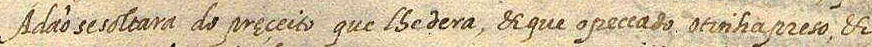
Adão se soltara do prEçeito que lhe dera, & que o peccado o tinha preso, &
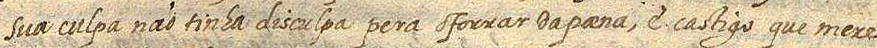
sua culpa naõ tinha disculpa pera o forrar da pœna, e castigo que mere
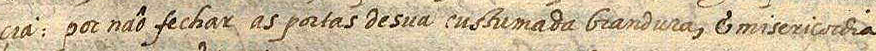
çia: por naõ fechar as portas de sua costumada brandura, e misericordia
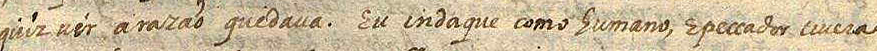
quiz uer a razão que daua. Eu inda que como humano, E peccador tiuera
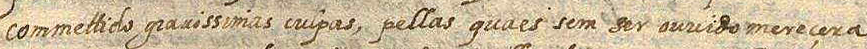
commettido grauissimas culpas, pellas quaes sem ser ouuido mereçera
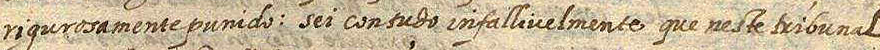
rigurosamente punido: sei contudo infalliuelmente que neste tribunaL
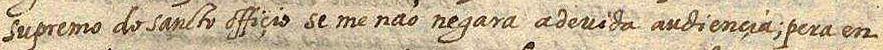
supremo do sancto offiçio se me não negara a deuida audiençia; pera en
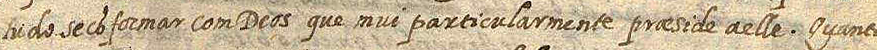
tudo se cōformar com Deos que mui particularmente præside a elle. Quanto
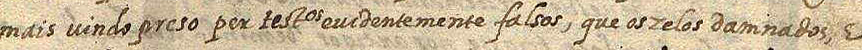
mais uindo preso per testos euidentemente falsos, que os zelos damnados, E
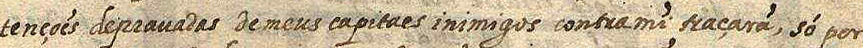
tenções deprauadas de meus capitaes inimigos contra mī traçarā , só por
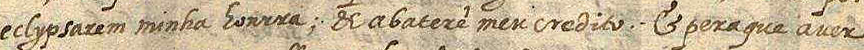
eclypsarem minha honrra; & abaterē meu credito. & pera que auer
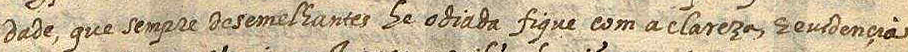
dade, que sempre de semelhantes he odiada fique com a clareza, E euidençia
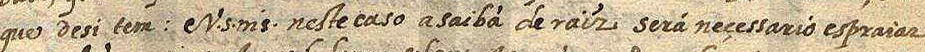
que de si tem: e V. s. ms. neste caso a saibā de raiz̄ será neçessario espraiar
